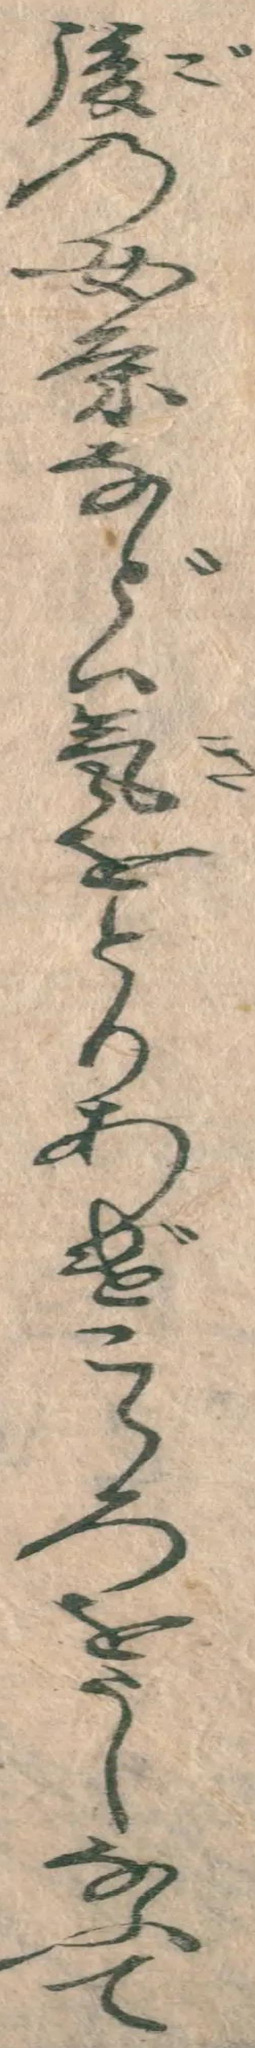後の女房などは気をとりあげこゝろをうしなふて
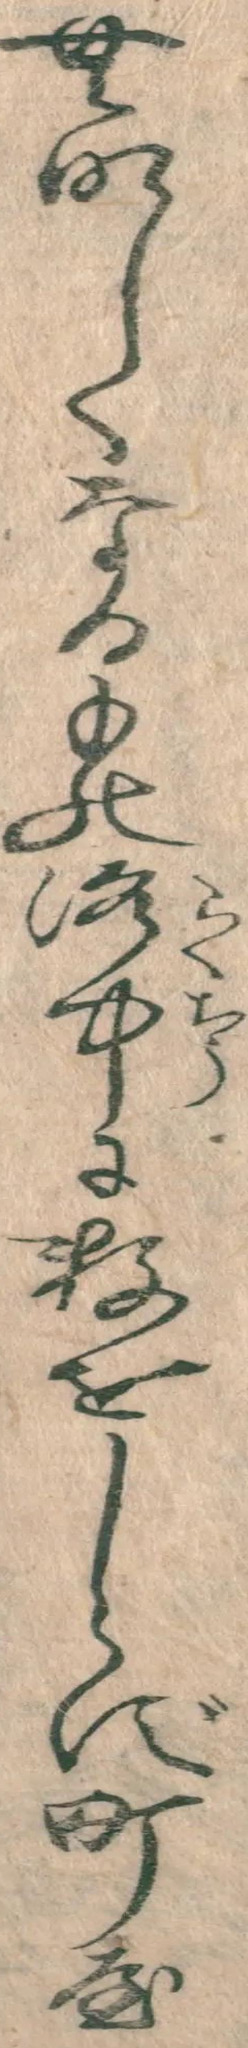むなしくなるもの洛中に数をしらず町屋
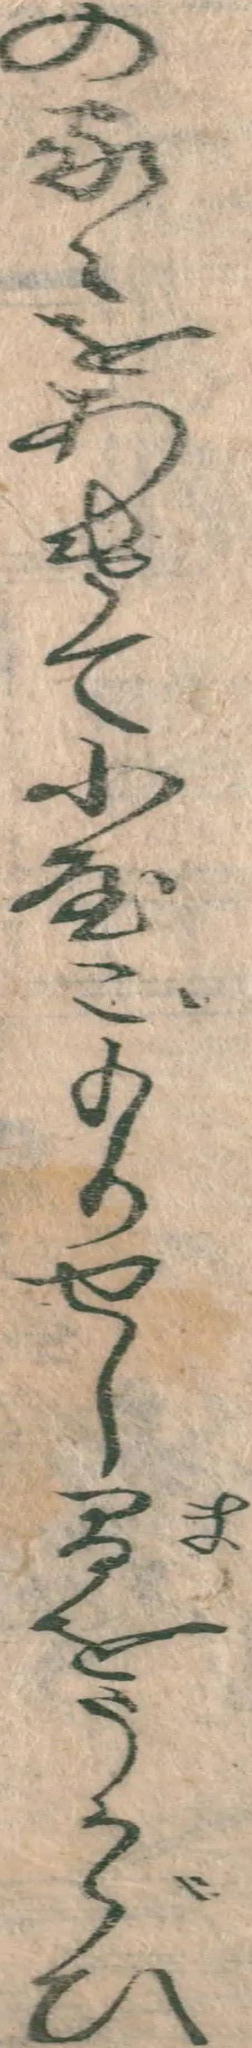の家々をあけて小屋こもりせし間をうかゞひ
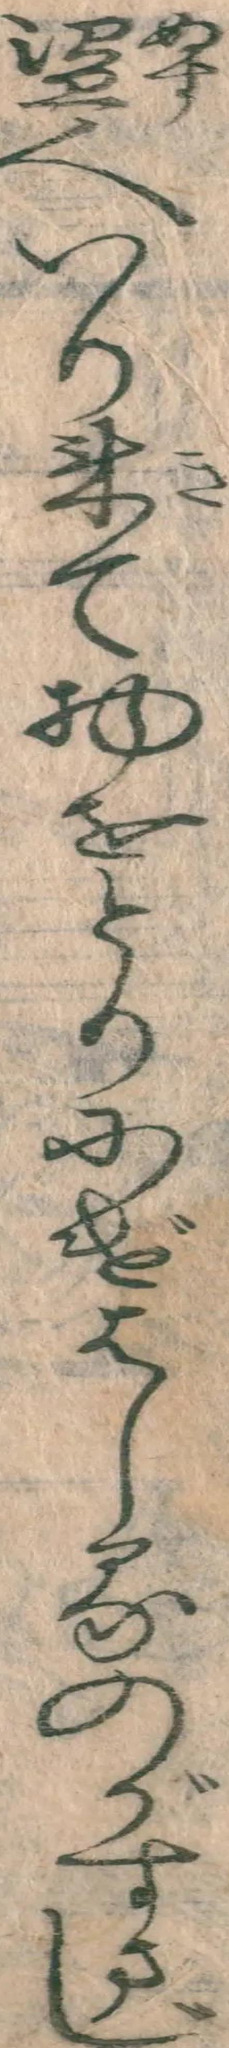盗人いり来て物をとりにげはしるのがすまし
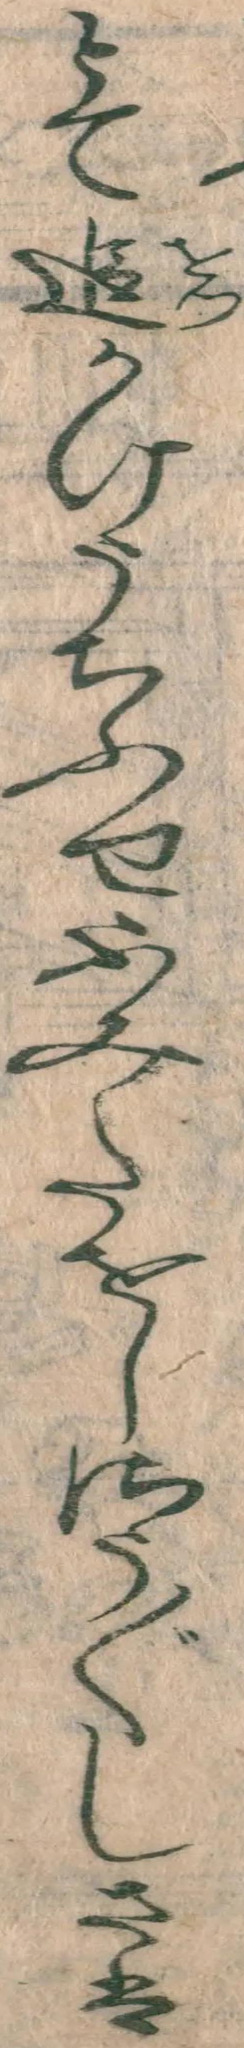とて追かけうちふせふみたをしさう〴〵しさは
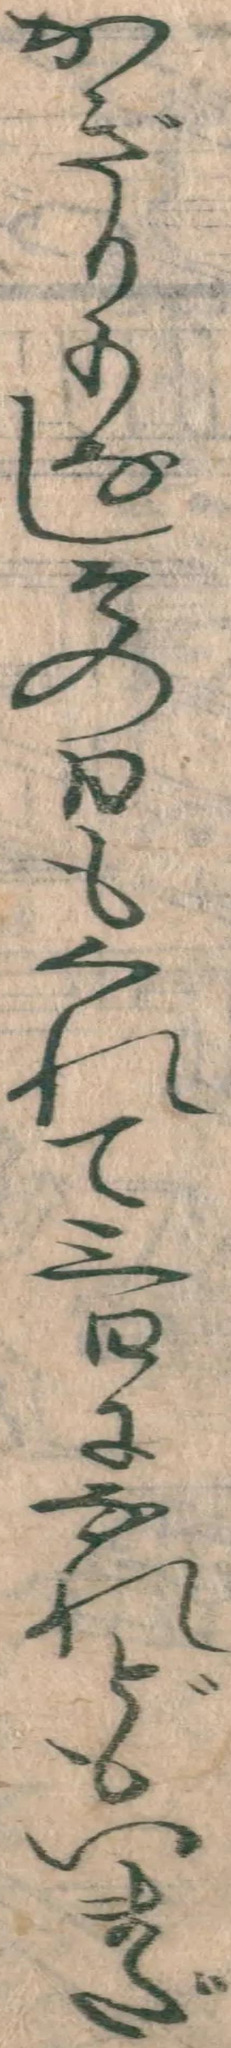かぎりもなしその日もくれて三日になれどもいまだ
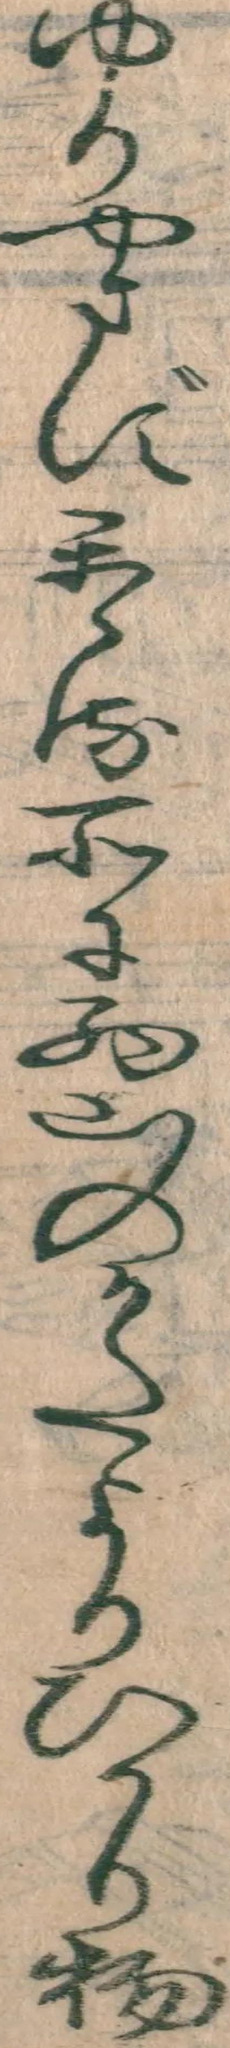ゆりやまずかゝる所に西山のかたよりひかり物
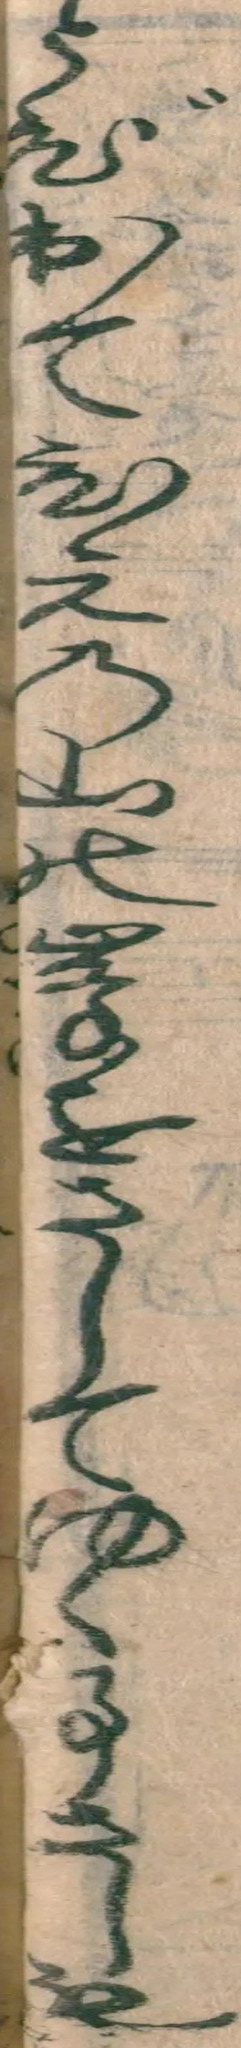とび出てひえのやまの峯をさしてゆく事さしも
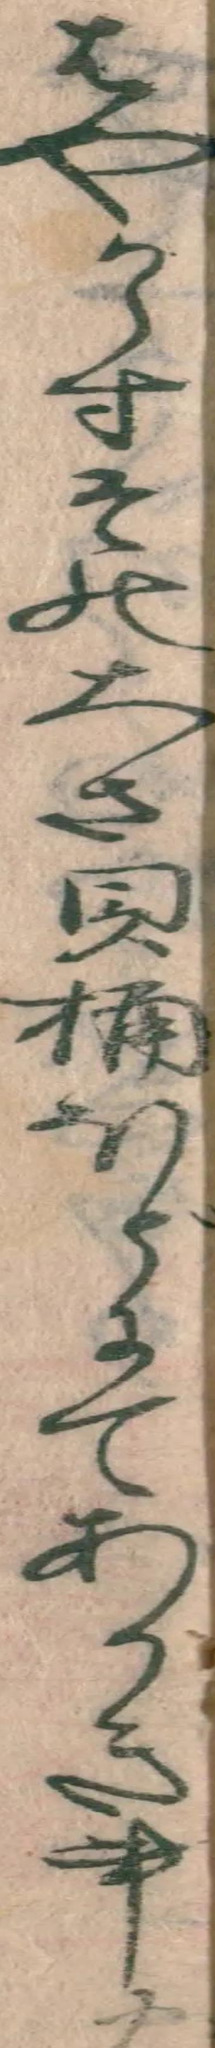はやからすその大さ貝桶ほどにてあかき事火
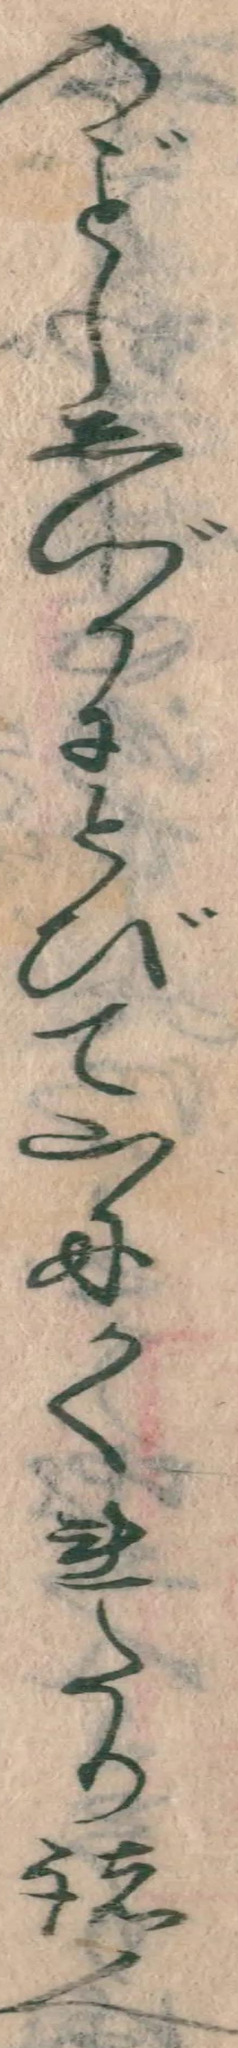のごとししづかにとびて山にかくれたり諸人
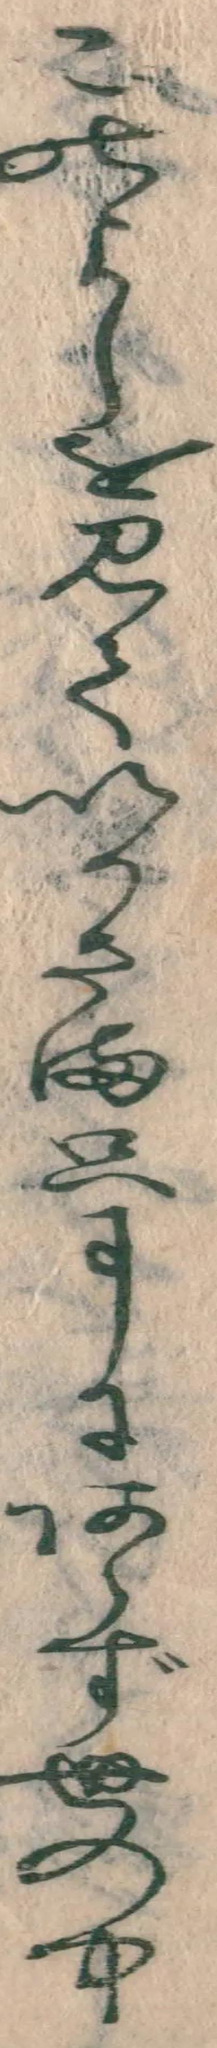このよしを見ていかさま只事にあらず世の中
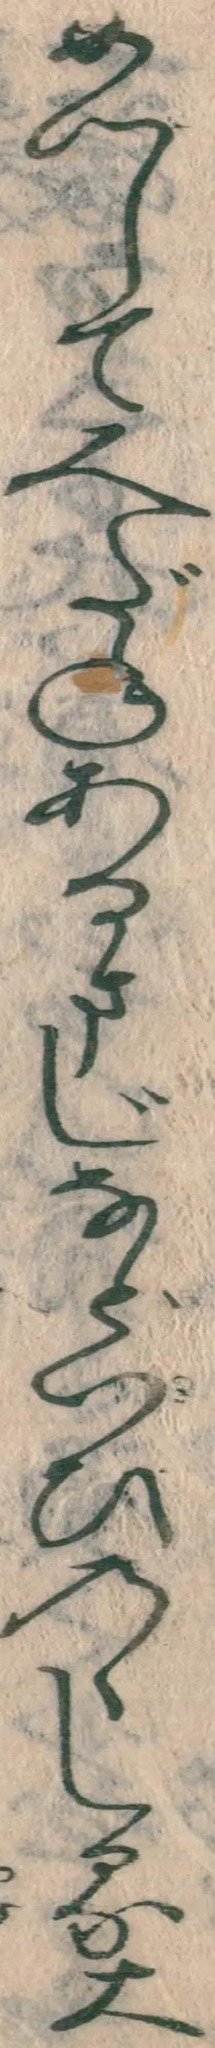めつして人だねあるまじなどいひのゝしる大
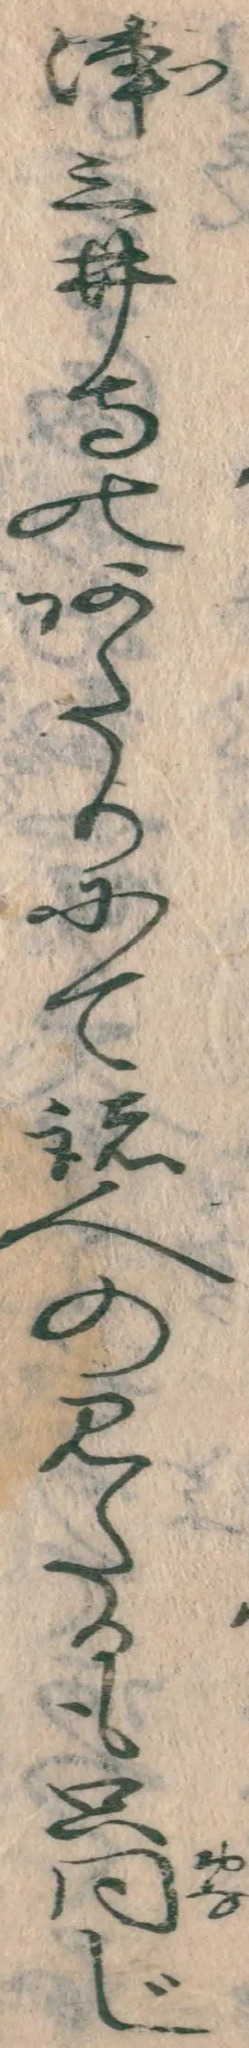津三井寺のあたりにて諸人の見たるもた只同じ
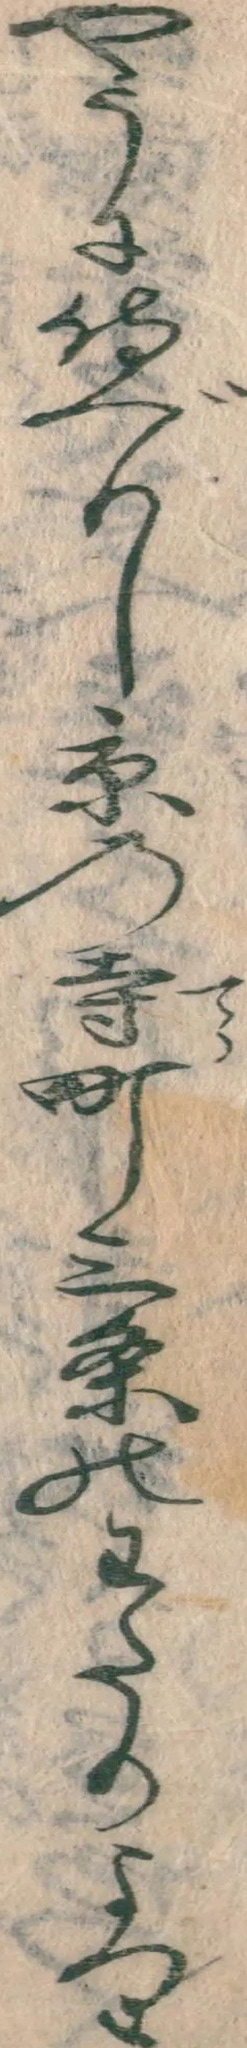やうに侍べりし京の寺町三条のわたりより
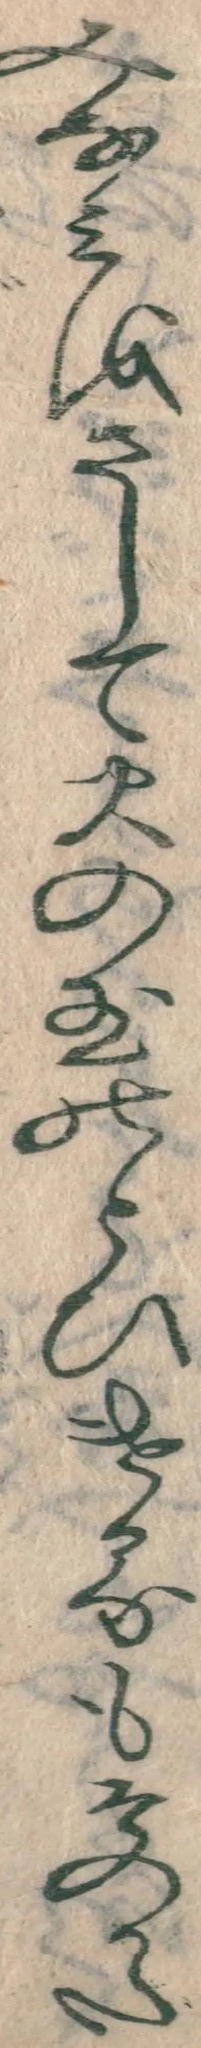みなみをさして火の玉のとびけるもそのかた
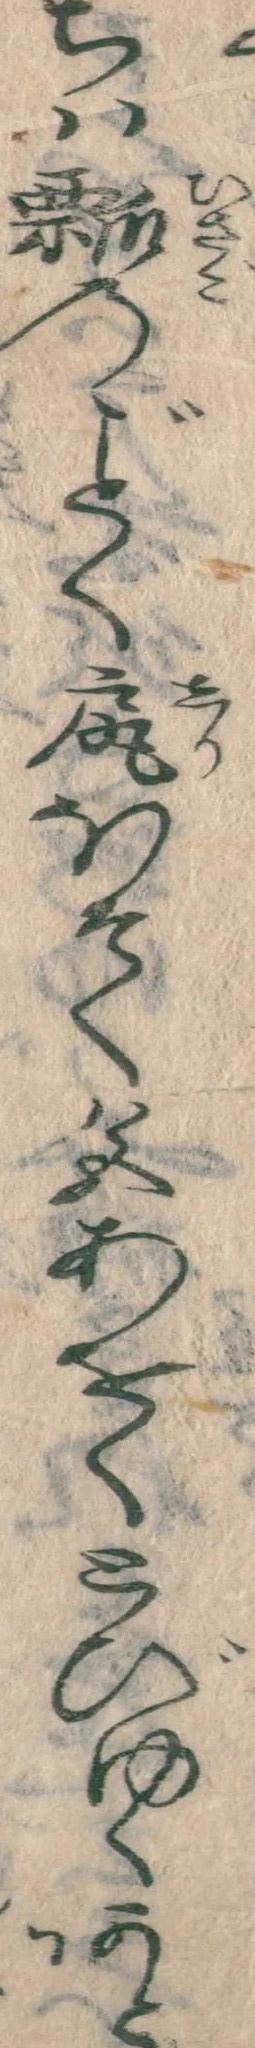ちは瓢のごとく尻ほそく色あをくとびゆくあと
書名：艱難目異志. 上,下
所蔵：国立国会図書館 National Diet Library, JAPAN
